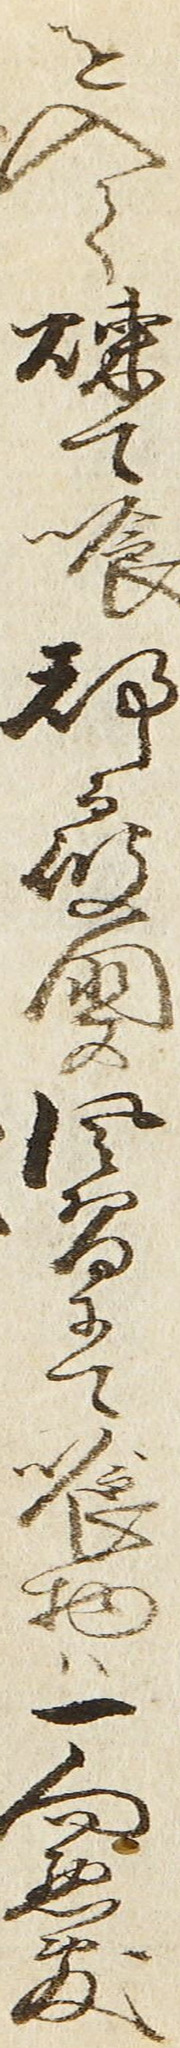を入て煉て喰都而彼国の風習にて喰物ハ一向悪敷
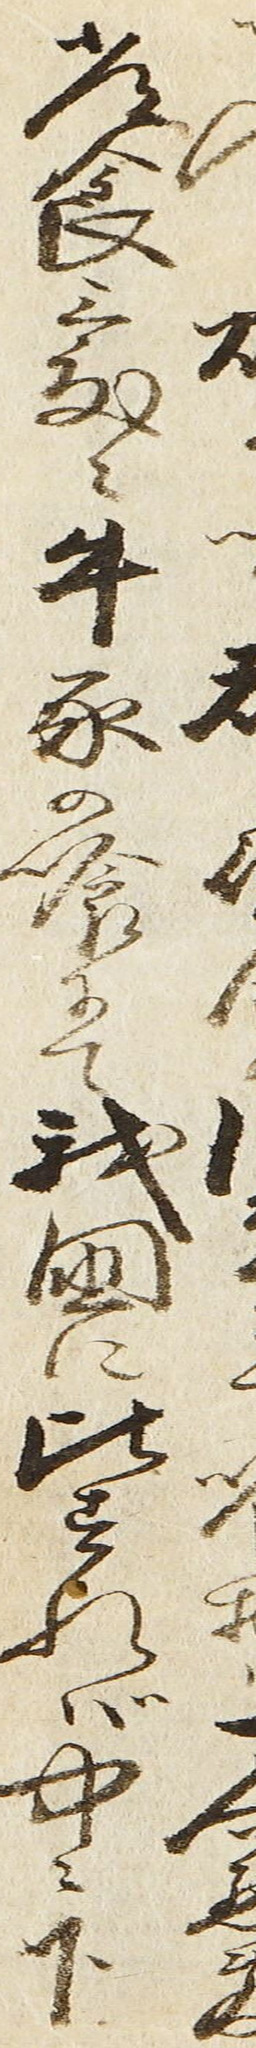常食三度々々牛豕の喰にて我国に比すれバ中々下
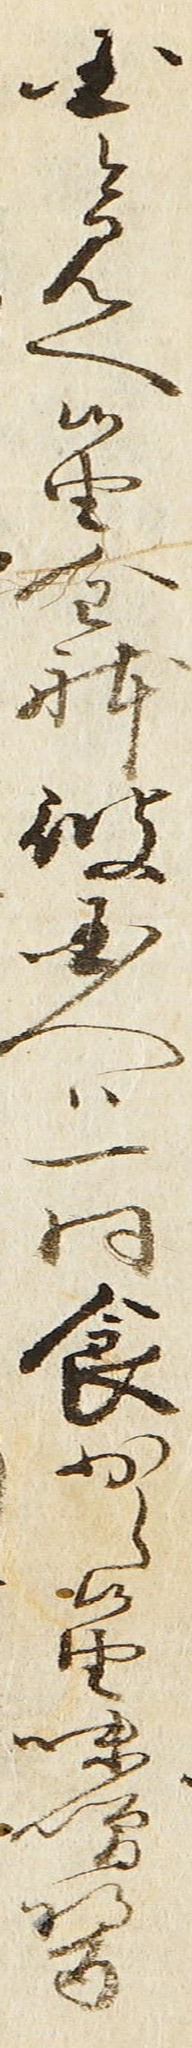国と見へ候由全体彼国人ハ一同食少く候由味噌醤
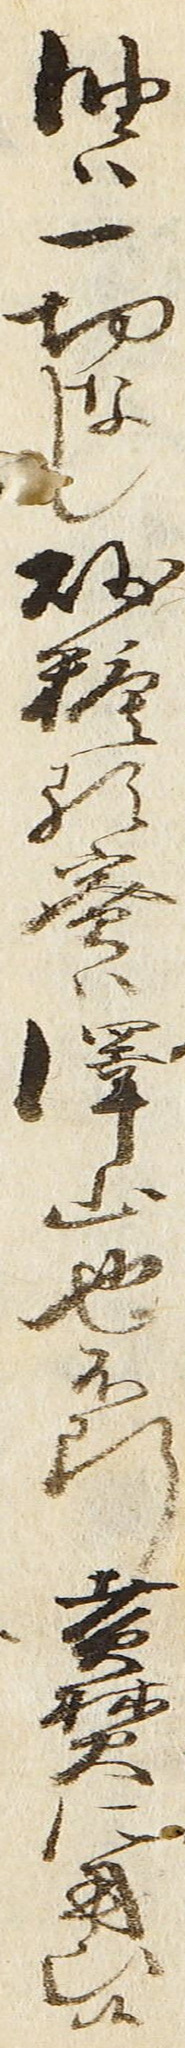油ハ一切なし砂糖類蜜ハ沢山也不断煮焚に用ひ候
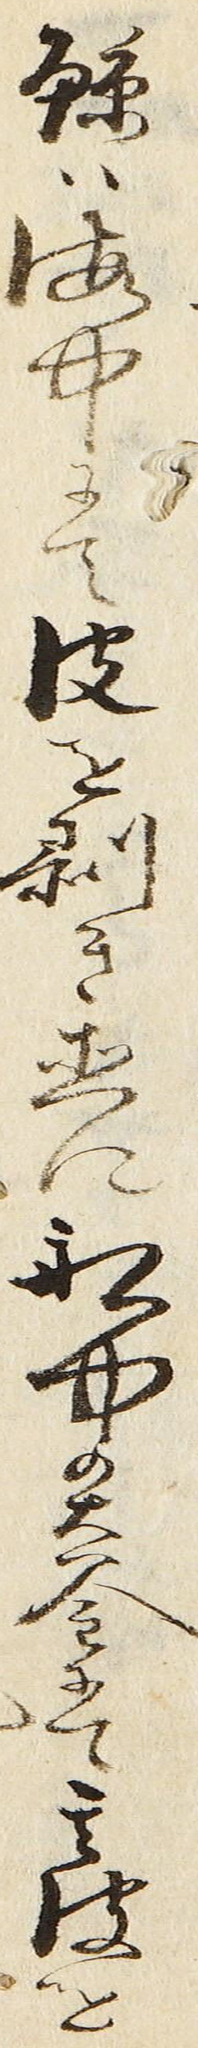鯨ハ海中にて皮を剥き直に船中の大釜にて其皮を
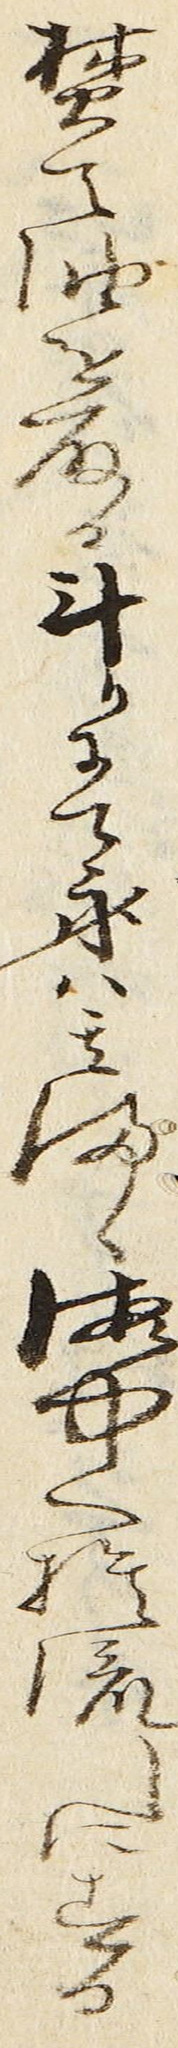焚て油を取る計りにて身ハ其まゝ海中へ捨流しにする
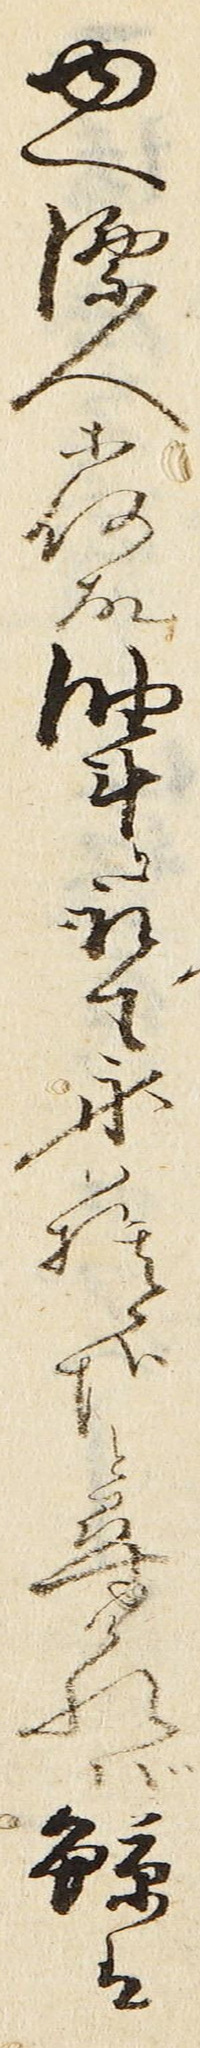ゆへ漂人等何故油計り取て身ハ捨候哉と尋れバ鯨は
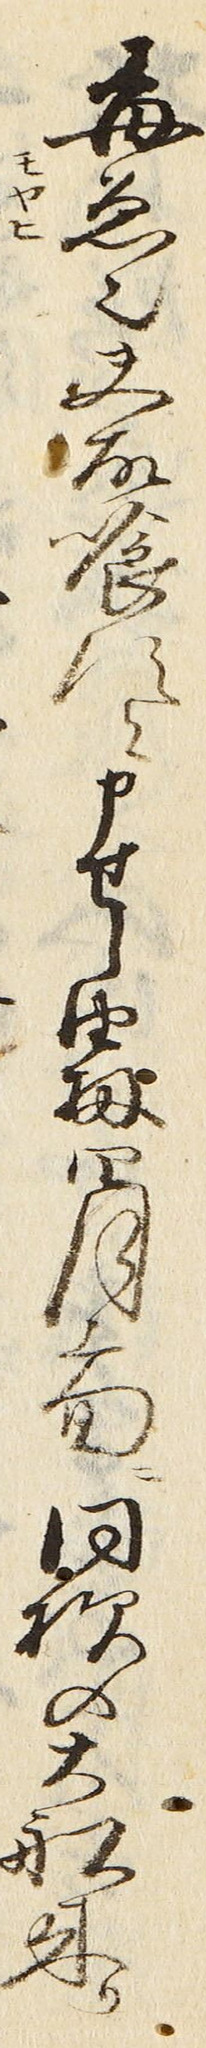毒魚也夫故喰すと申せし由扨四月上旬ニ同様の大船来り
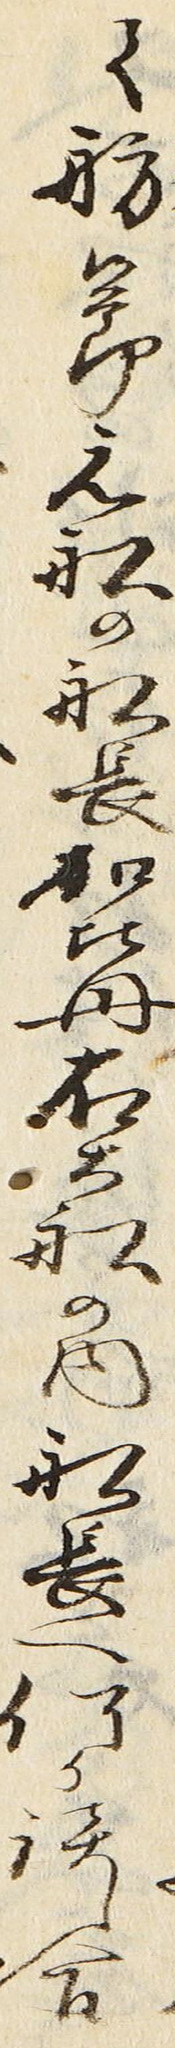て舫候節元船の船長加比丹右大船の内船長へ何か談し合
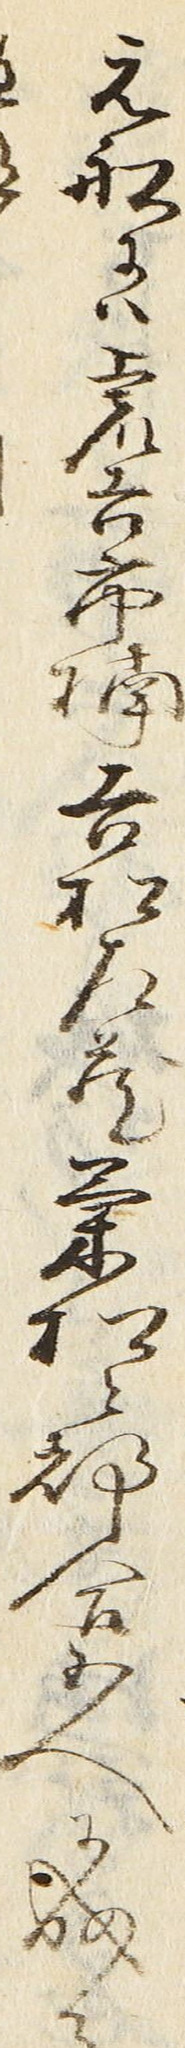元船には虎吉市楠吉松左蔵菊松と都合五人に成る
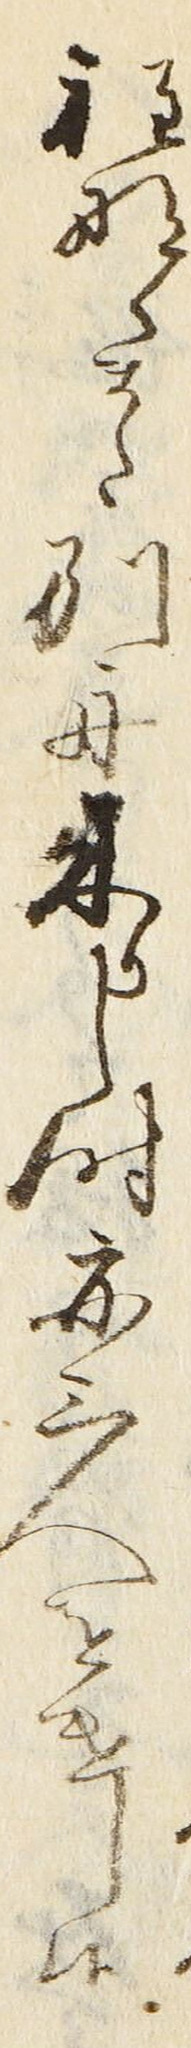程なくまた別舟来りし時亦三人を遣し候
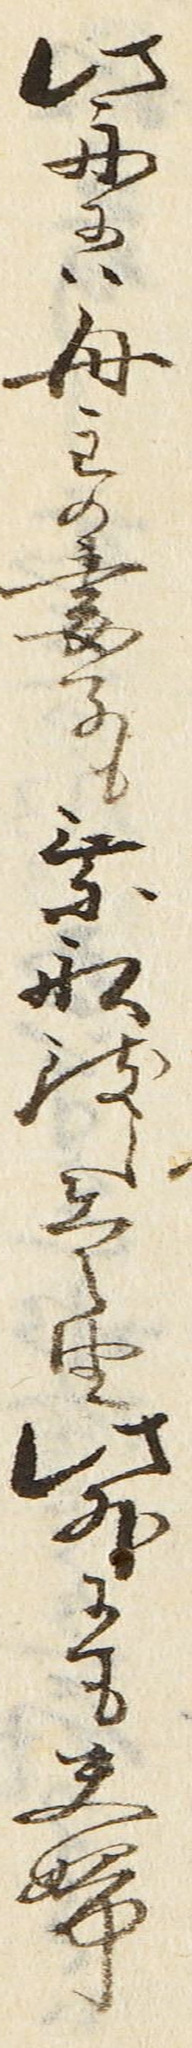此舟にハ舟主の妻子も乗船致し在し由此外にも夫婦
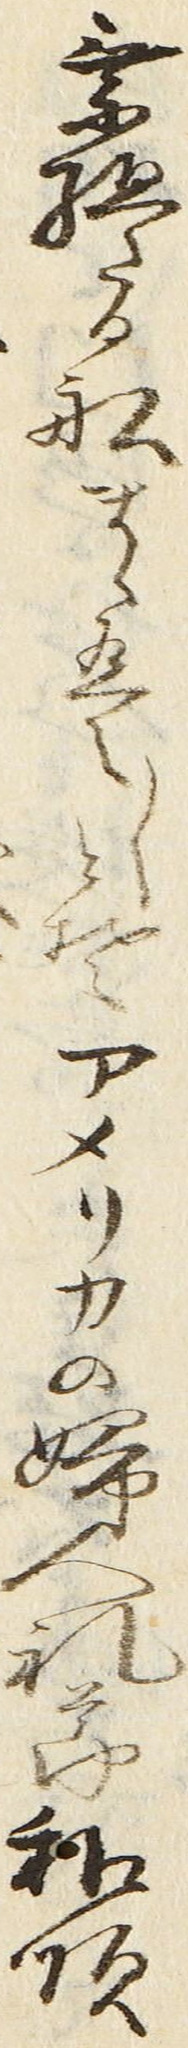乗組たる船まゝ有之しとそアメリカの婦人礼節和順
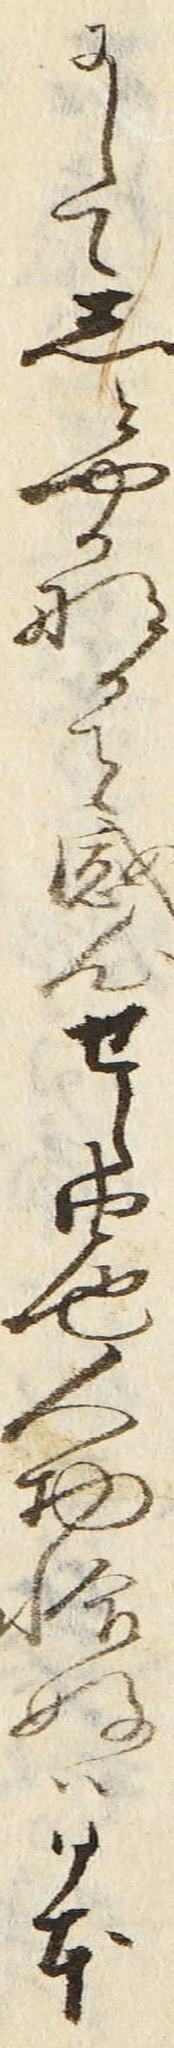にしてしとやかなること感心せし由也人物恰好ハ日本
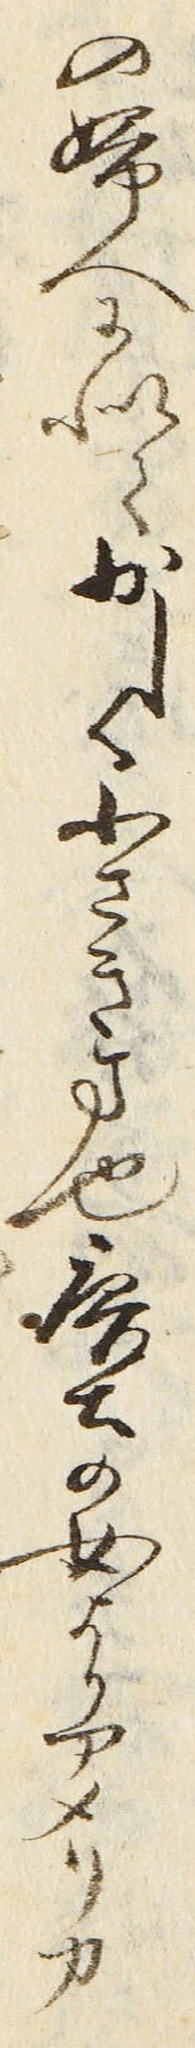の婦人に似て少しく小さき方也唐土の女よりアメリカ
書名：亜墨利加漂流記聞
